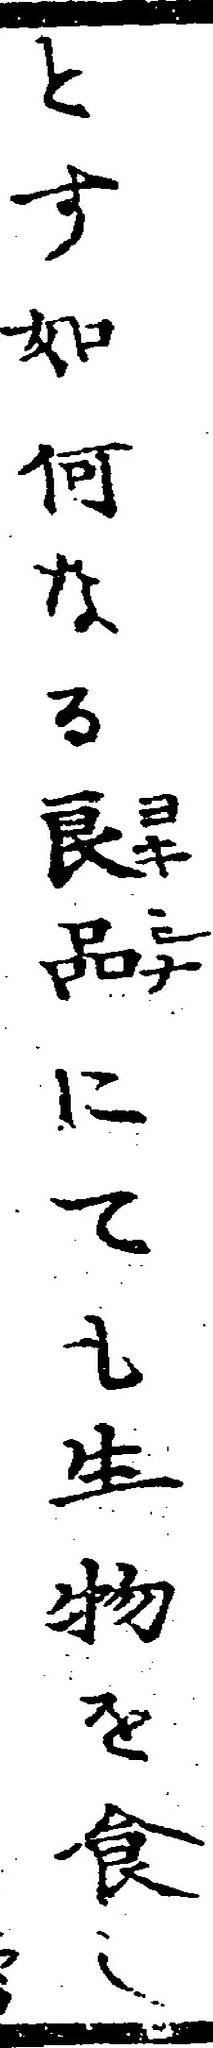とす如何なる良品にても生物を食し
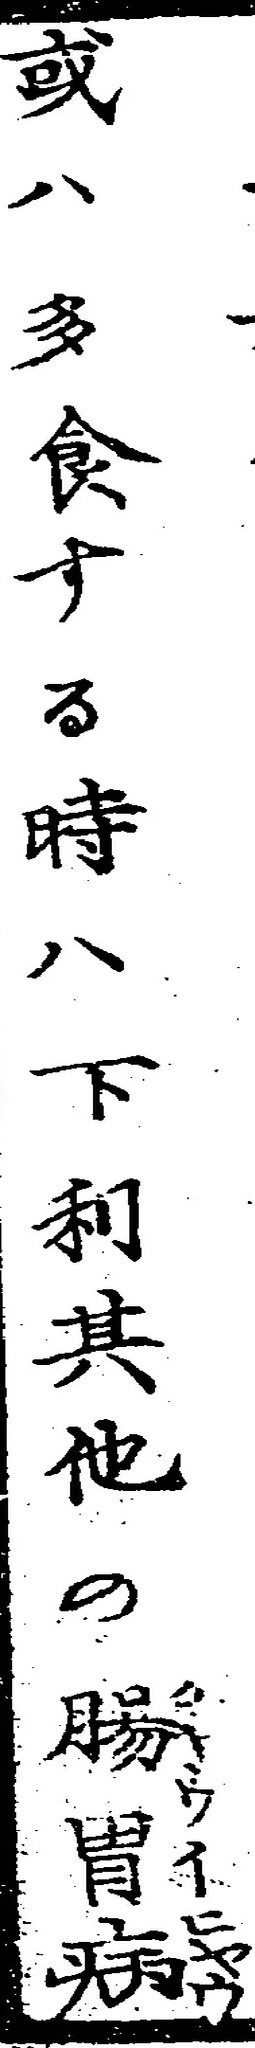或は多食する時は下利其他の腸胃病
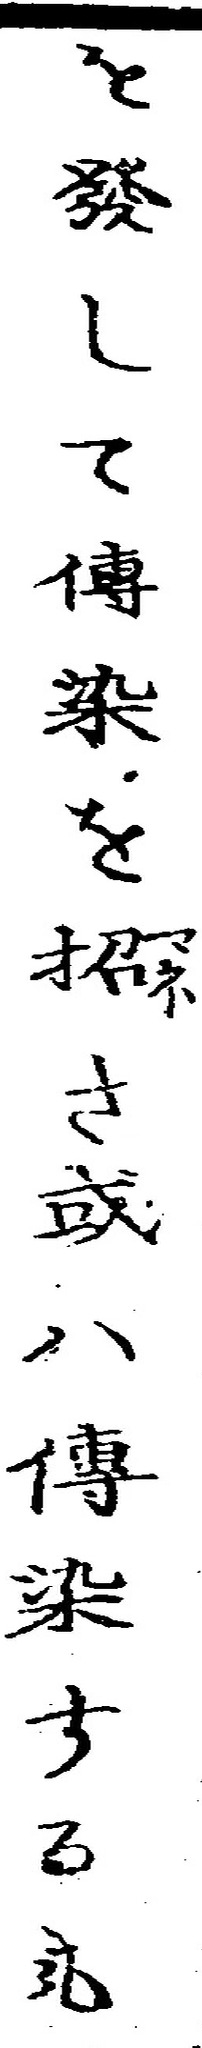を發して傅染を招き或は傅染するも
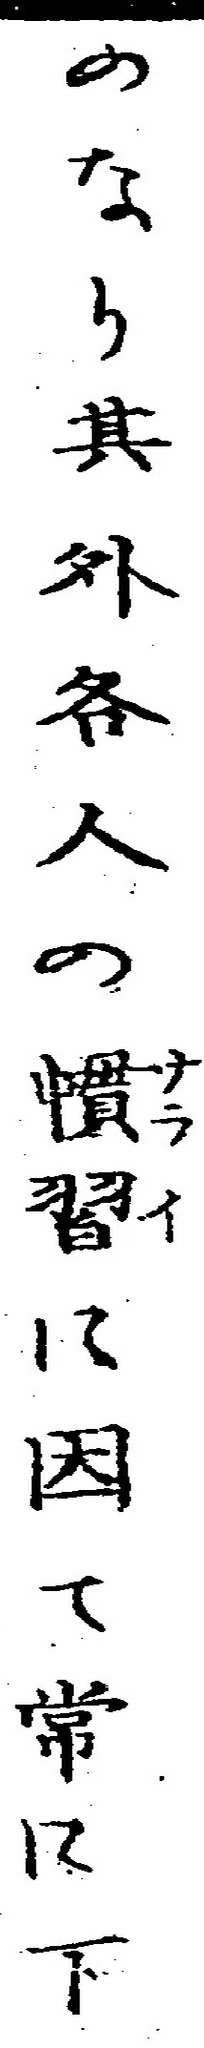のなり其外各人の慣習に因て常に下
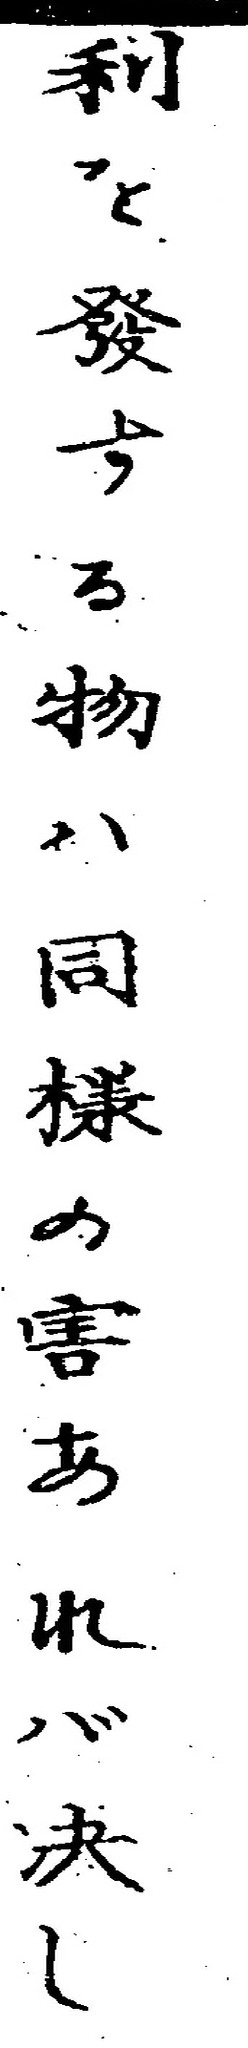利を發する物は同様の害あれば決し
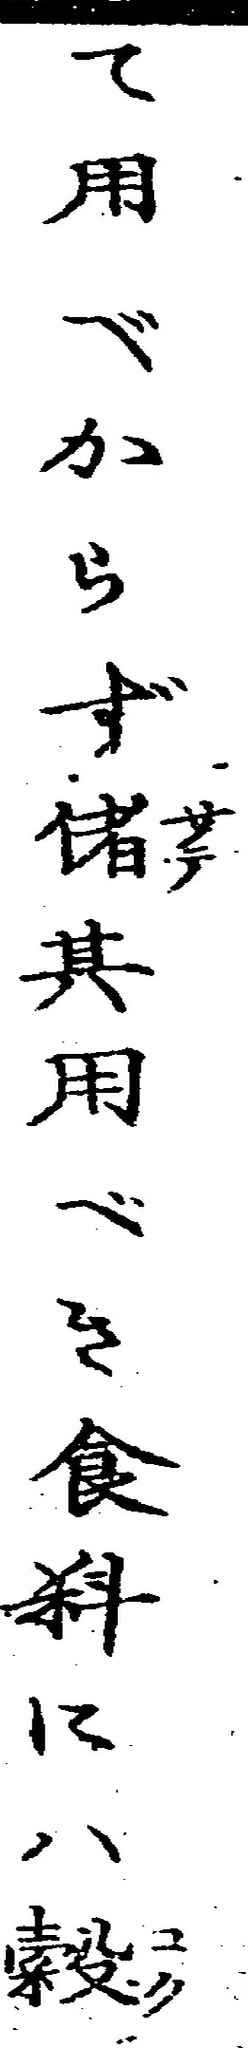て用べからず偖其用べき食料には穀
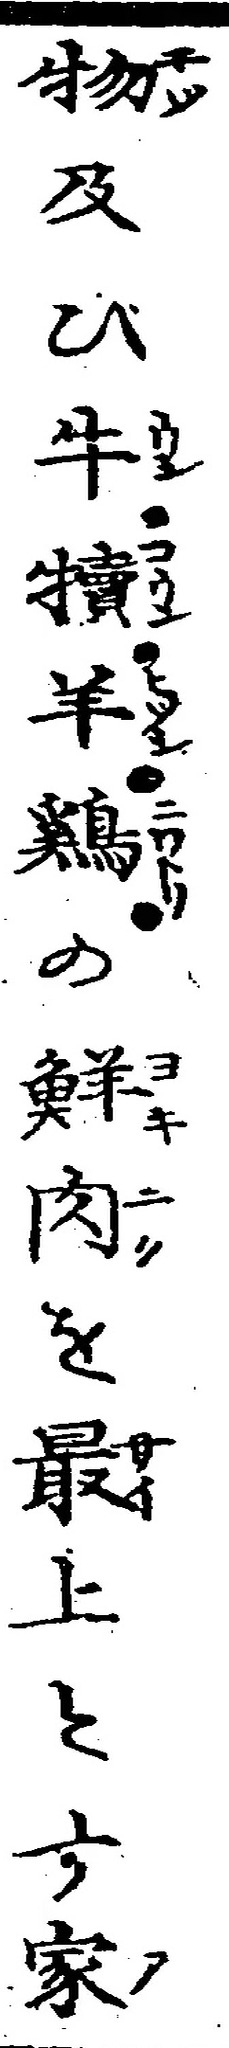物及び牛、犢、羊、鶏、の鮮肉を最上とす家
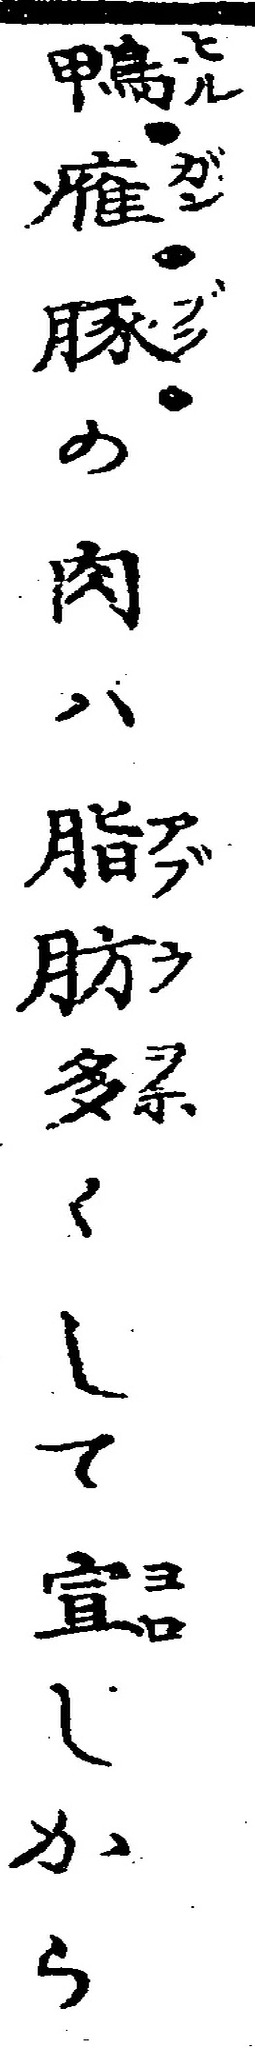鴨、雁、豚、の肉は脂肪多くして宜しから
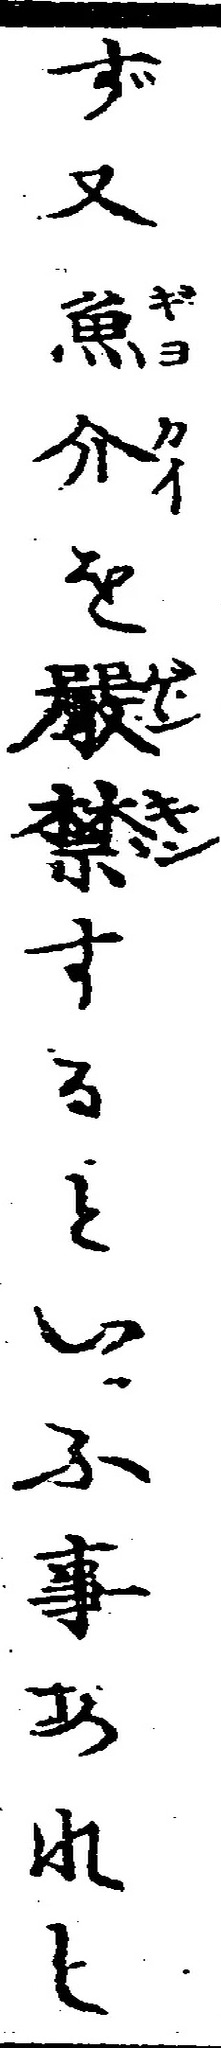ず又魚介を厳禁するといふ事あれど
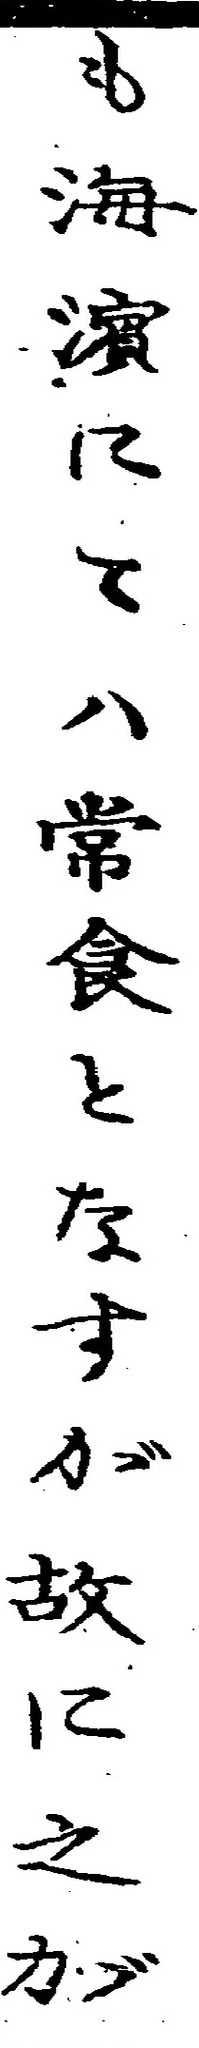も海濱にては常食となすが故に之加

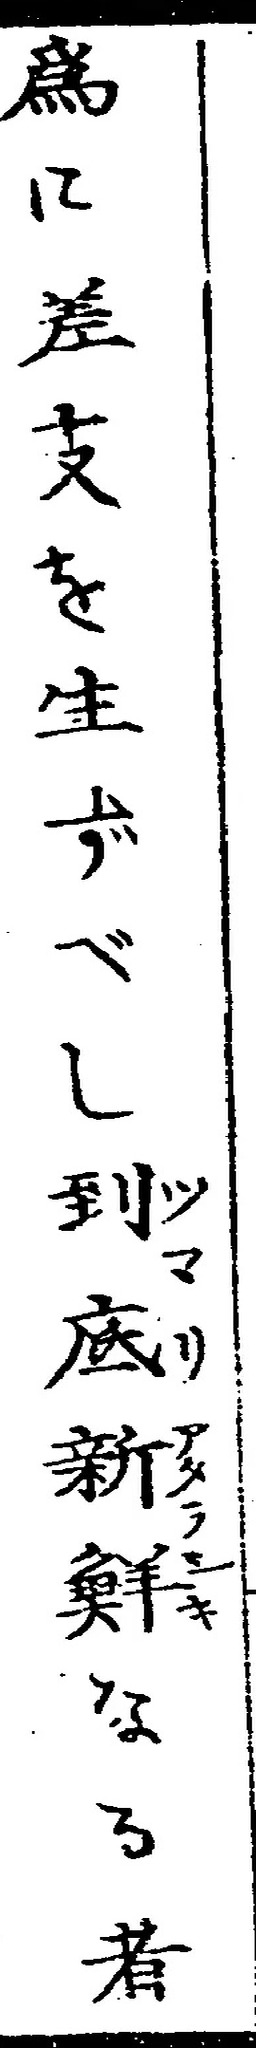為に差支を生ずべし到底新鮮なる者
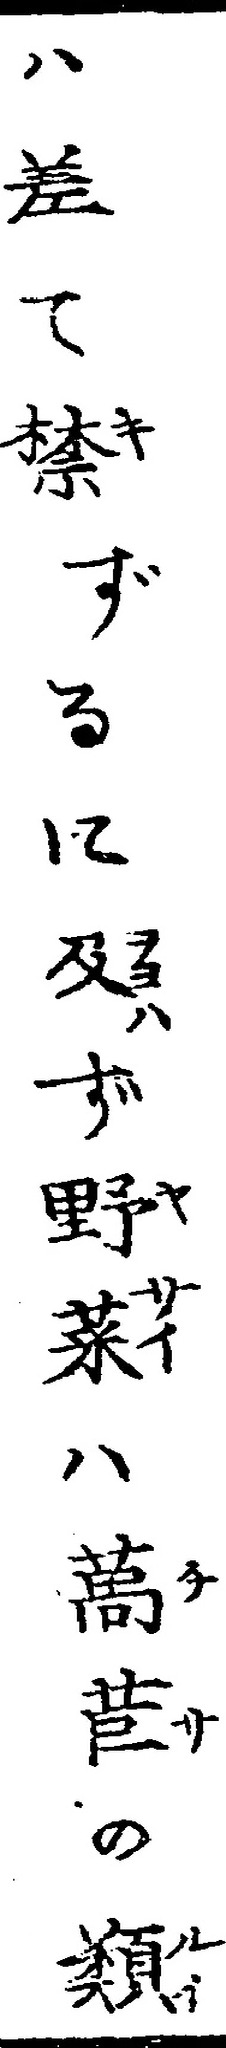は差て禁ずるに及ず野菜は萵苣の類
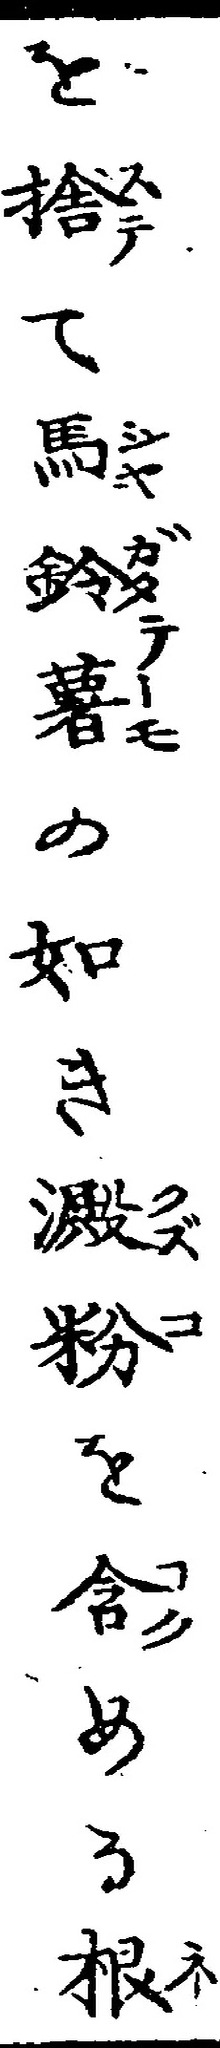を捨て馬鈴薯の如き澱粉を含める根
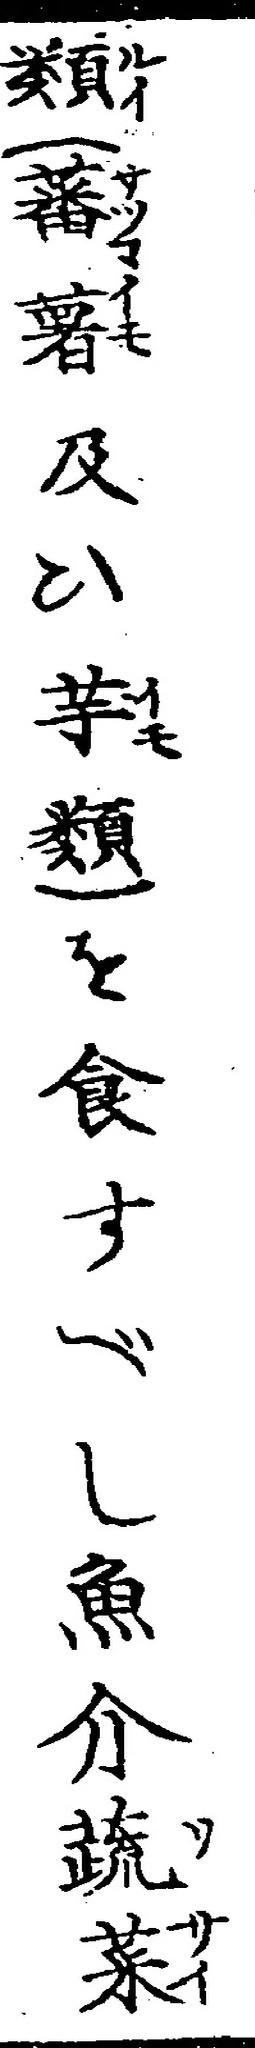類[蕃薯及ひ芋類]を食すべし魚介蔬菜
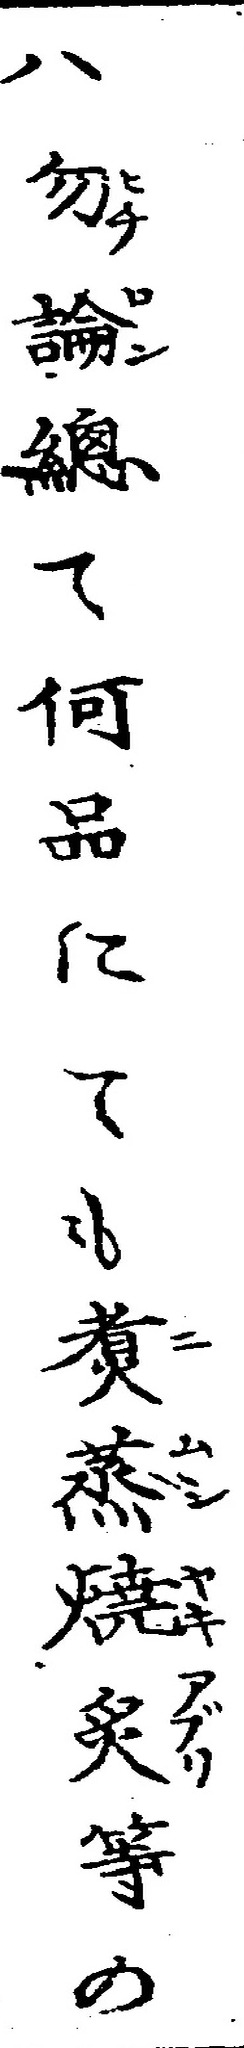は勿論總て何品にても煑蒸焼炙等の
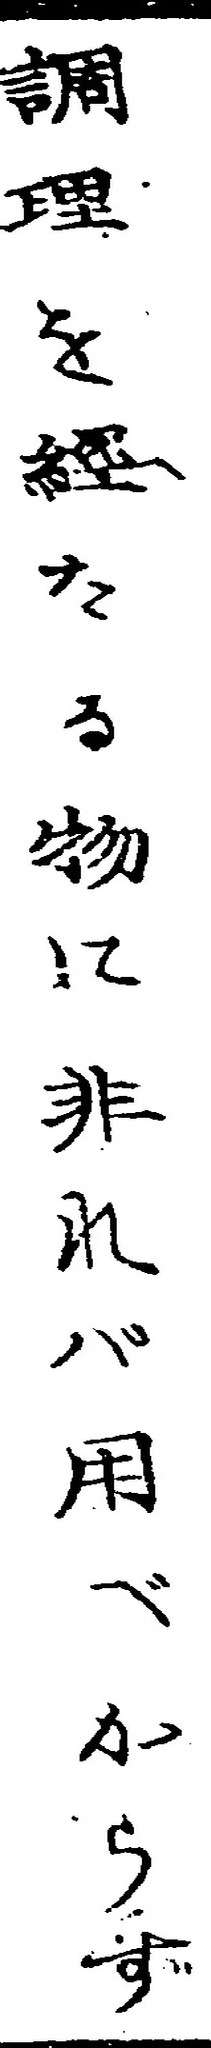調理を経たる物に非れば用べからず
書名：虎列剌病予防用法
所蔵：国立国会図書館 National Diet Library, JAPAN
